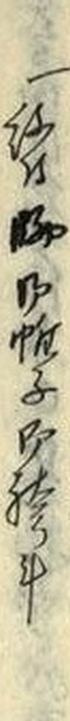紋付晒御帷子御袴斗
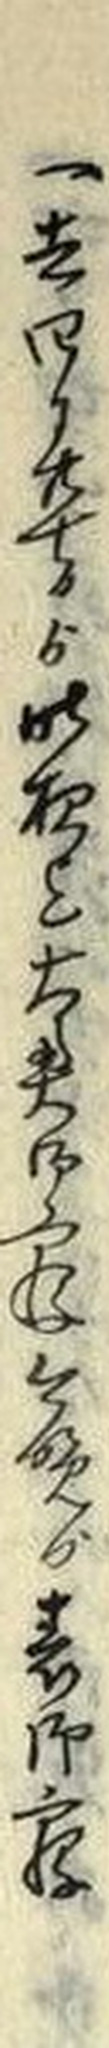一去四月廿七日ゟ昨夜迄大奥御寝今晩ゟ表御寝
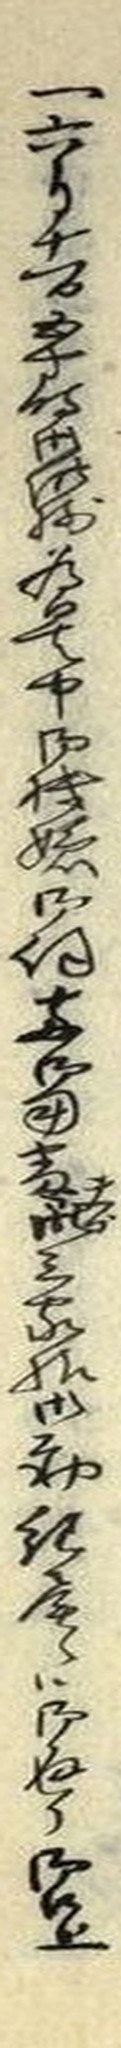一六月十一日五半時御供揃為暑中御機嫌御伺両御用番夫ゟ御三家様御勤紀尾へハ御通り御口上
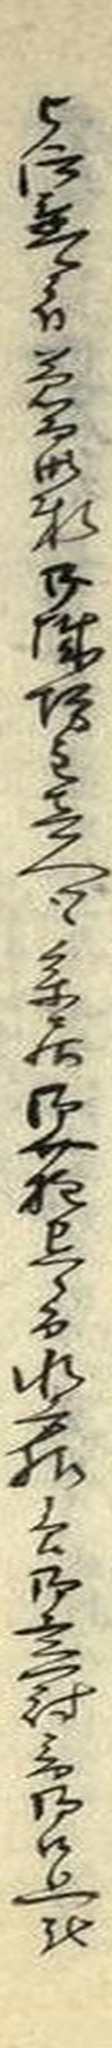被仰置候ニ付兼而御頼御城坊主壱人ツヽ参居御介抱申上候而水戸様ニ而ハ御玄冠ニ而御口上被
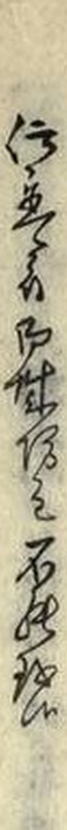仰置候ニ付御城坊主不罷越候
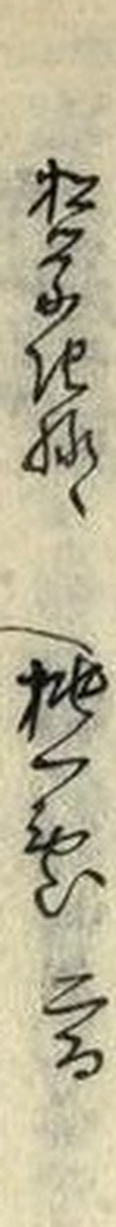松栄院様へ桃一台二百
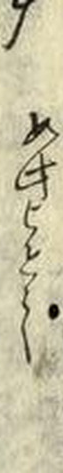如此被進之
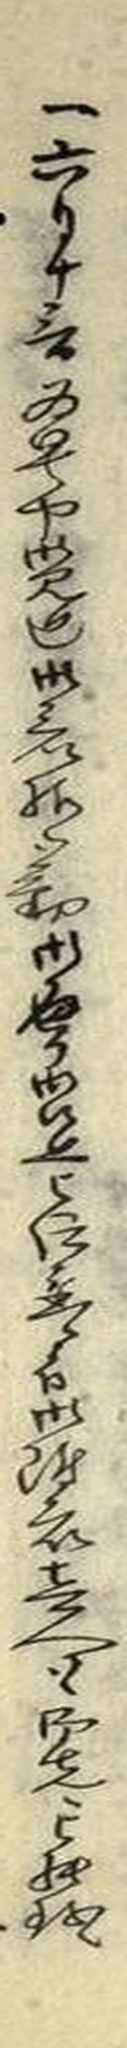一六月十三日為暑中御見廻御三卿様御勤御通り御口上被仰置候ニ付御附衆壱人ツヽ御先へ被罷越候
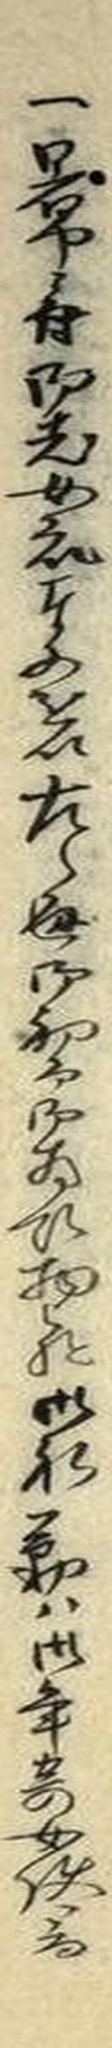一暑中ニ付御老女衆奉文を以左之通御初而御拝領物被遊御礼勤ハ御年寄女使へ為

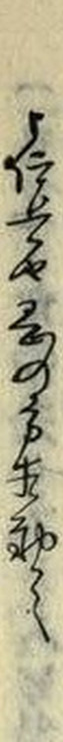被仰上候由岡の方相勤之
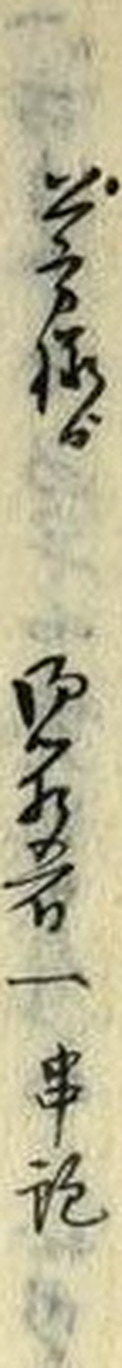公方様ゟ御箱肴一串鮑
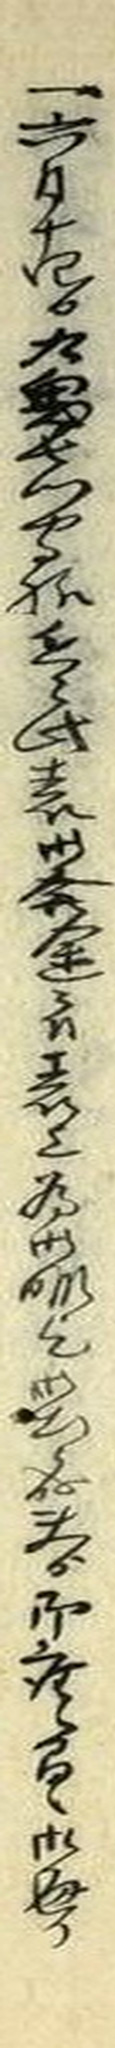一六月十四日九鬼長門守様近々此表御発途ニ付表迄為御暇乞御出被成夫ゟ御座之間へ御通り
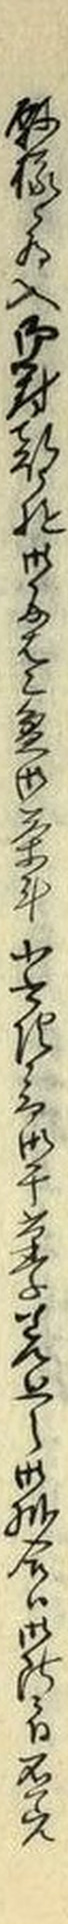殿様被為入御対顔被遊御たはこ盆御茶斗小書院ニ而御干菓子差上之御掛合ハ御断ニ付不差
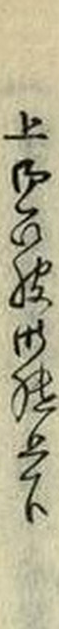上御召服御継上下
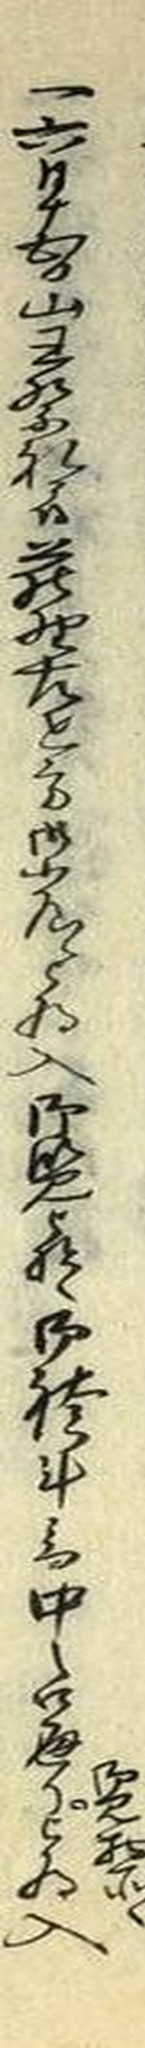一六月十五日山王祭礼ニ付荻野左近方御小屋へ被為入御覧被遊候御袴斗ニ而中之口通り御見物所へ被為入
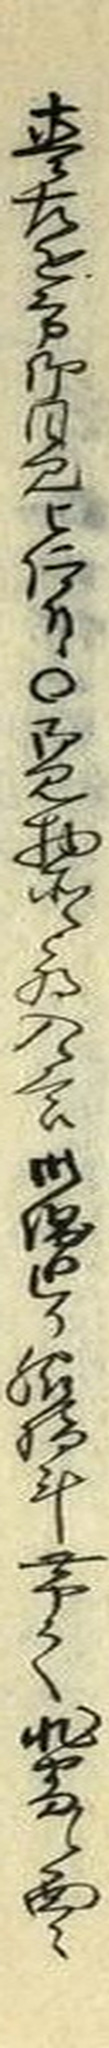直ニ左近方御目見被仰付候〇御見物所へ被為入候節御側廻り脇指斗帯之非番之面々
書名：少傅日録抄（斉善付側向頭取日記、在府）
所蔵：福井県文書館 Fukui Prefectural Archives
